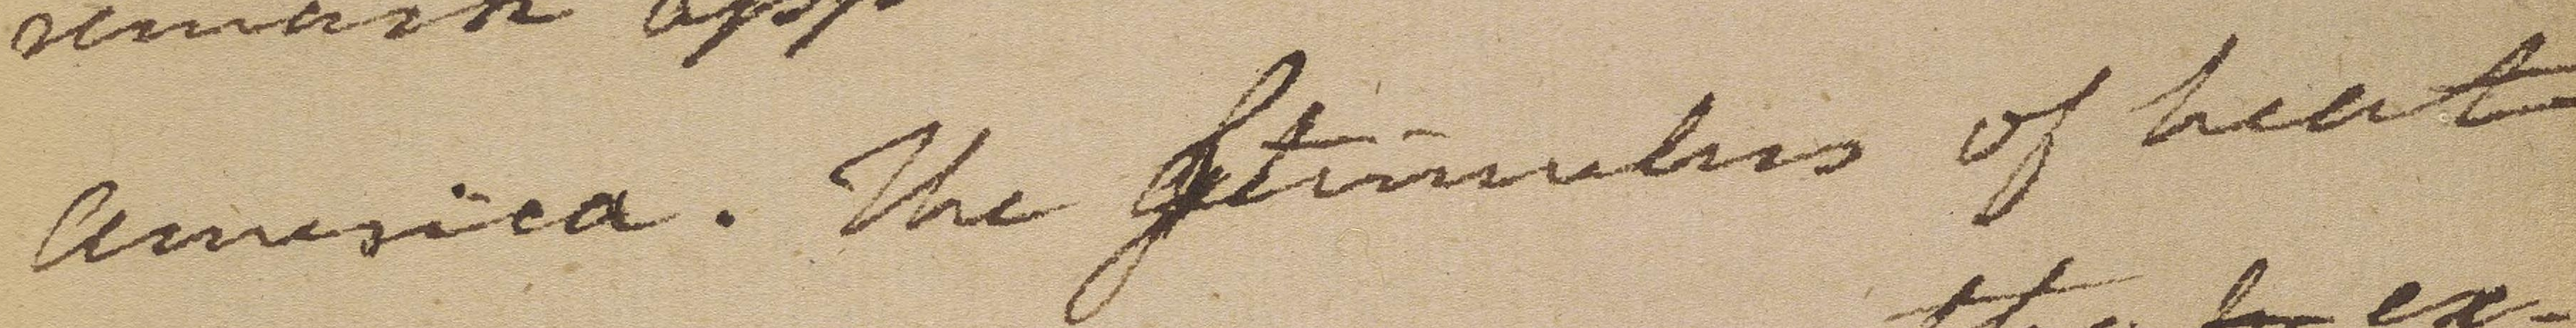America. The Stimulus of heat
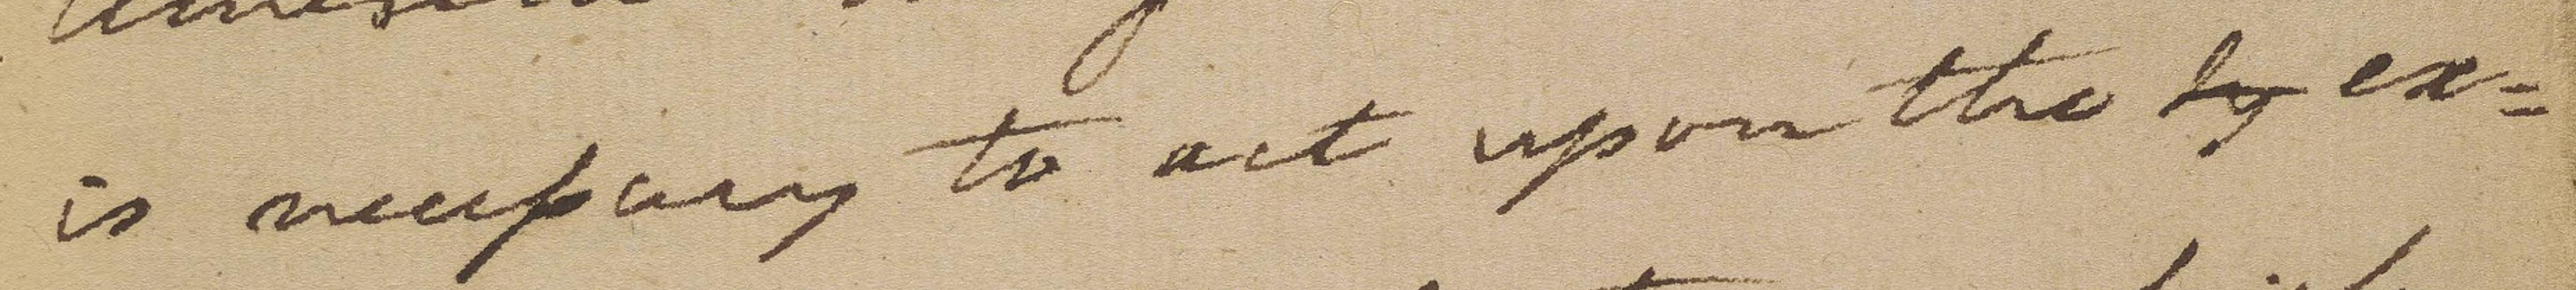is necessary to act upon the ex-
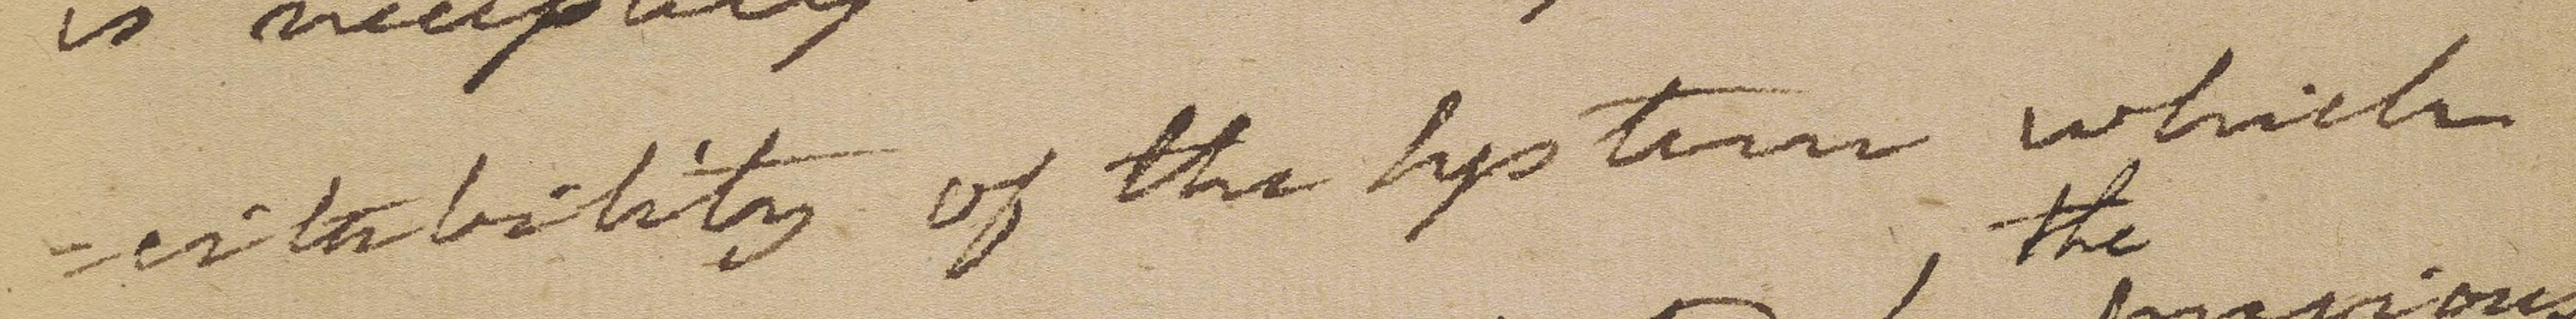-citability of the system which
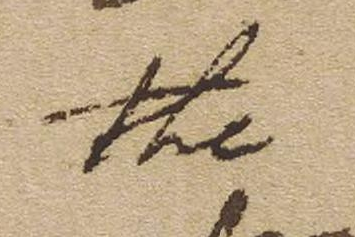the
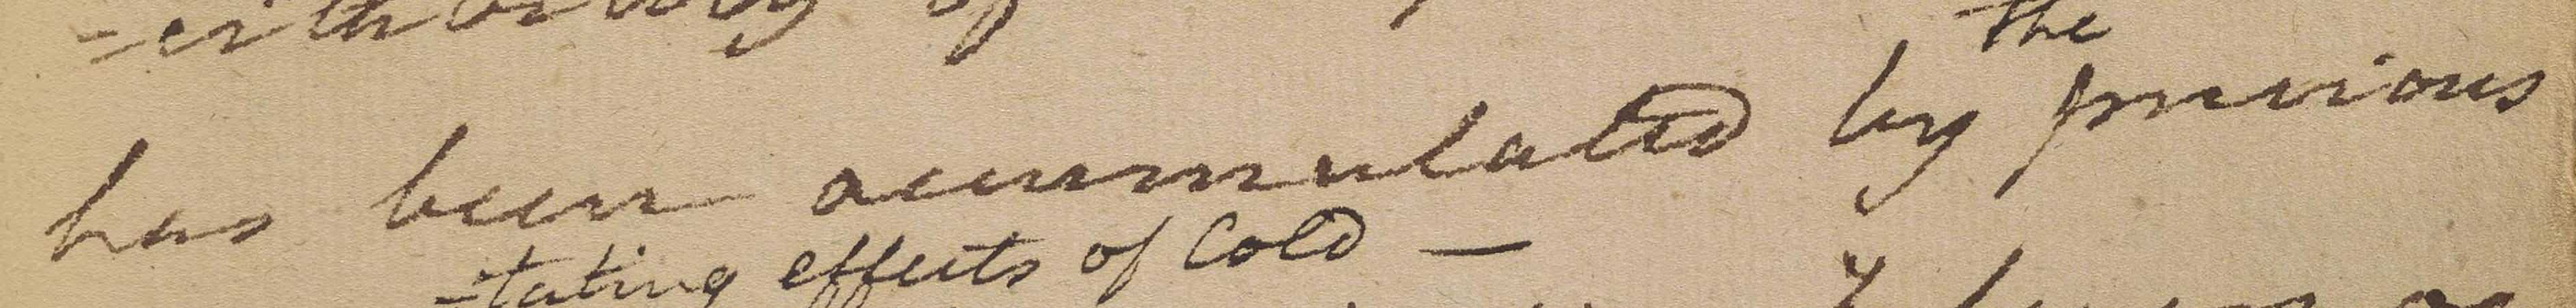has ben accumulated by previous
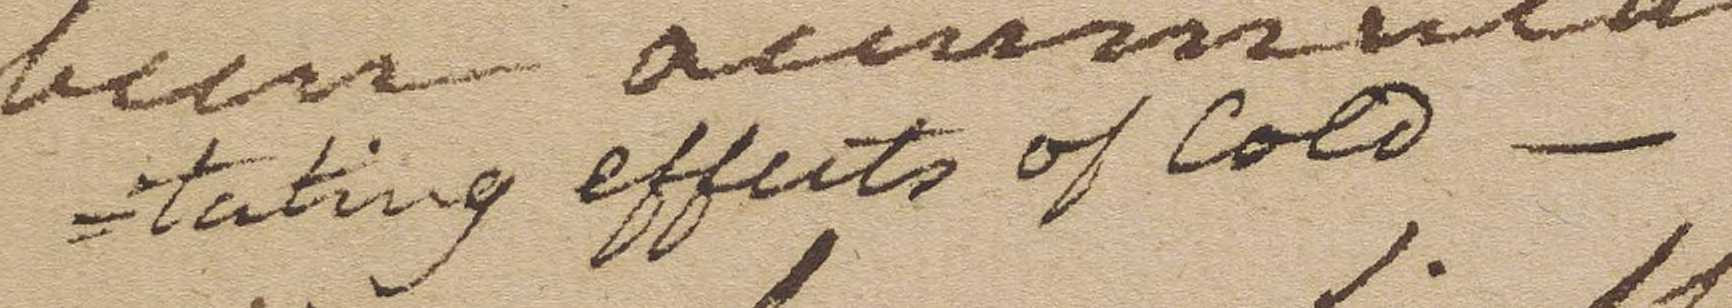-tating effects of cold,
